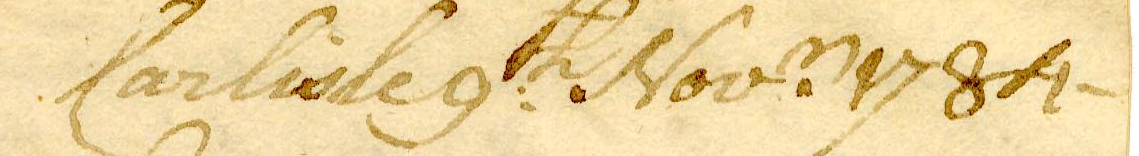Carlisle 9^th Nov^r. 1784
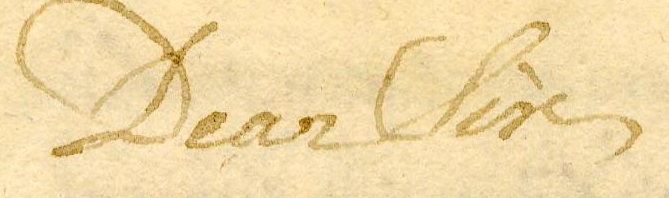Dear Sir
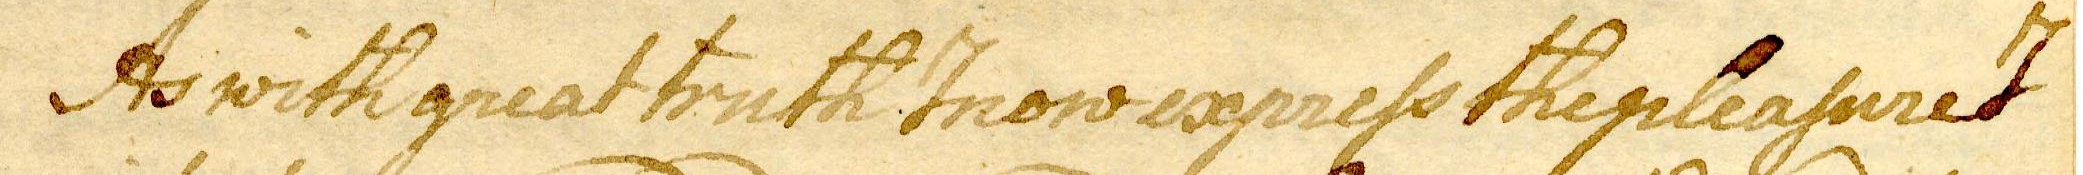As with great truth I now express the pleasure of
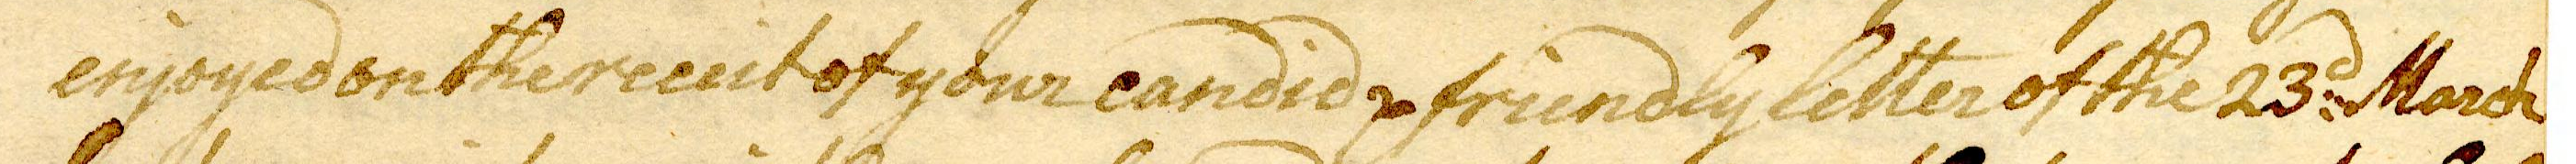enjoyed on the receit of your candid & friendly letter of the 23^d: March
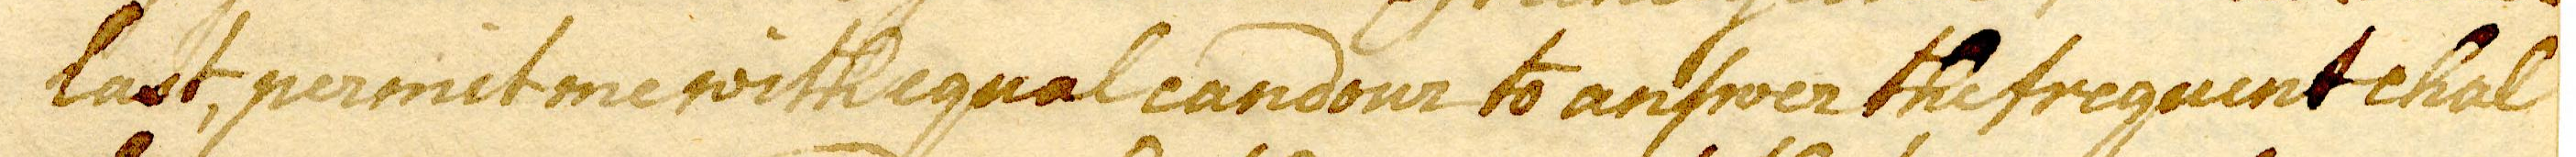last, permit me with equal candour to answer the frequent chal
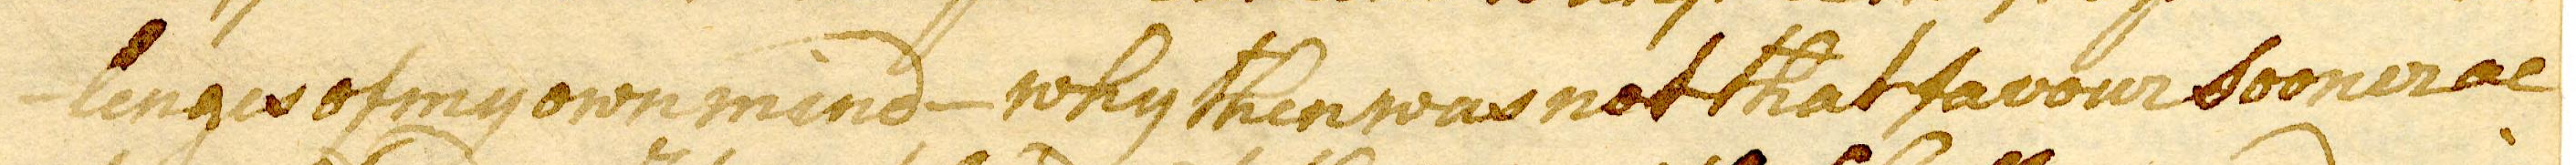-lenges of my own mind- why then was not that favour sooner ac
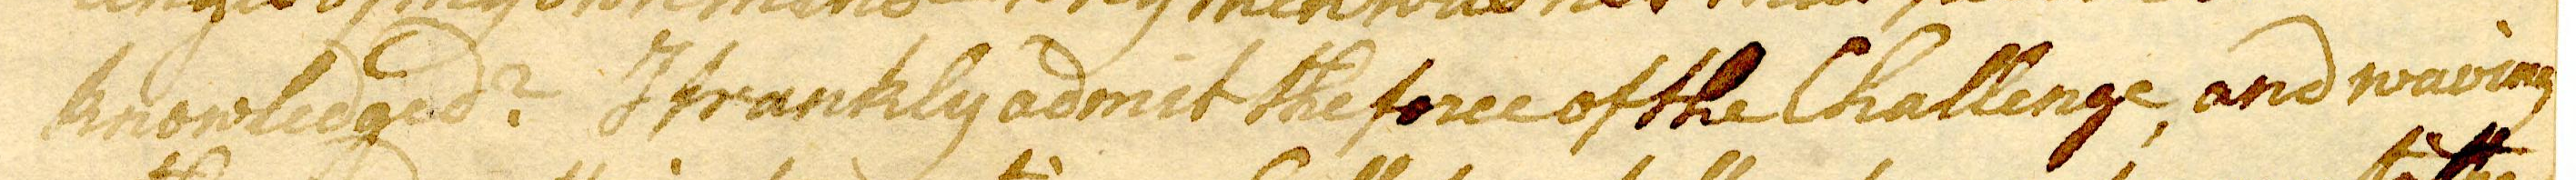knowledged? I frankly admit the force of the Challenge, and waving
